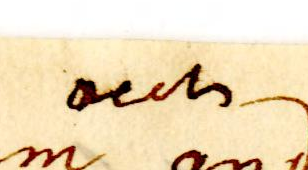out
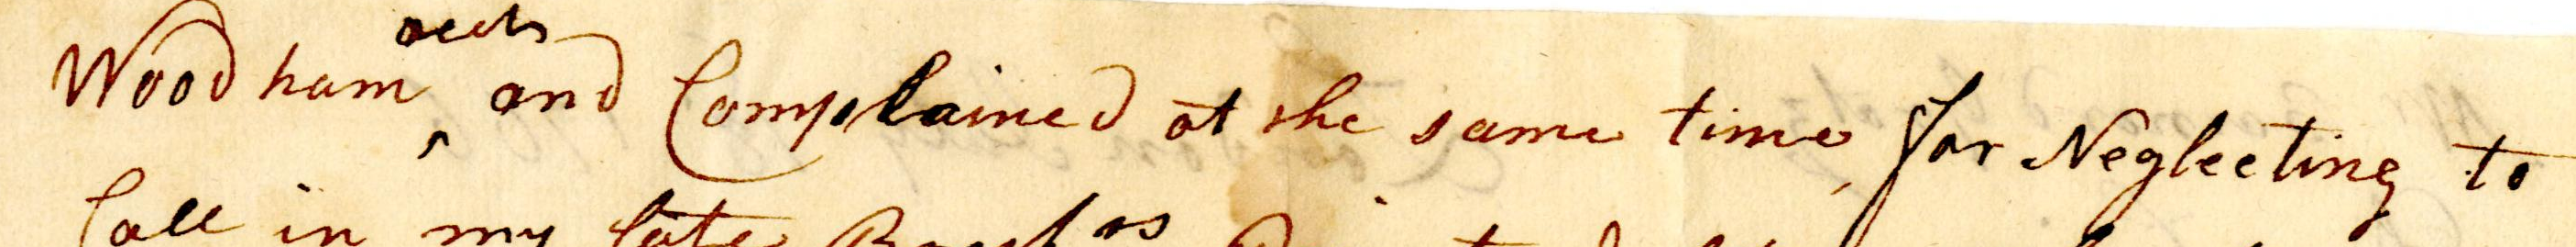Woodham ^ and Complained at the same time for Neglecting to
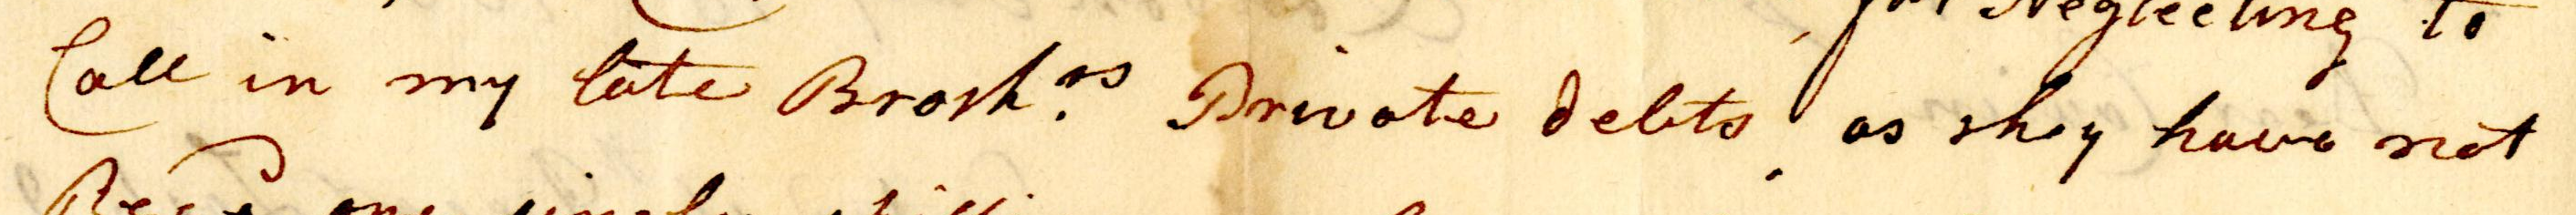Call in my late Broth^rs. Private debts as they have not
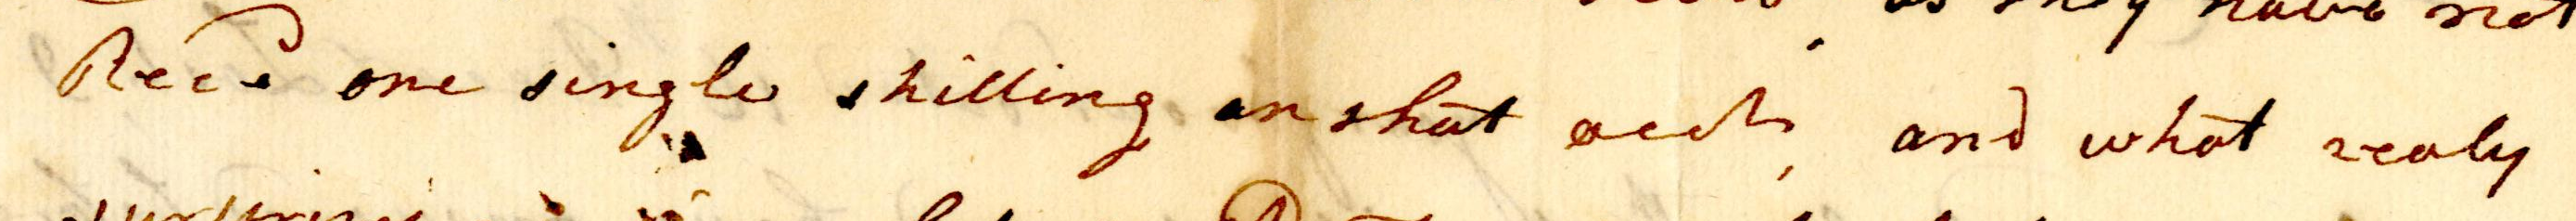rece^d one single shilling on that acc^t and what realy
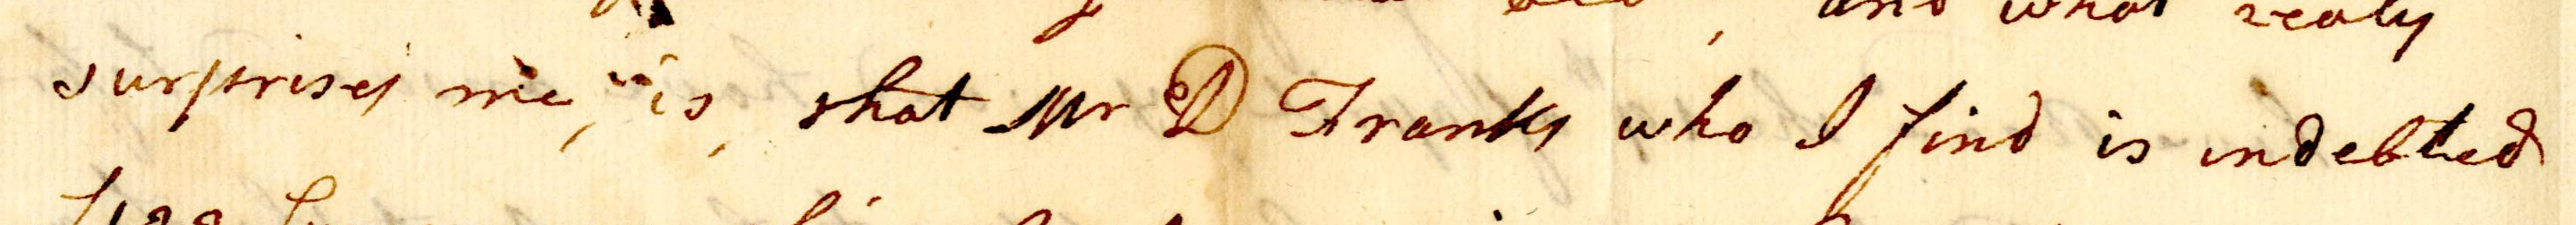surprises me is that M^r D Franks who I find is indebted
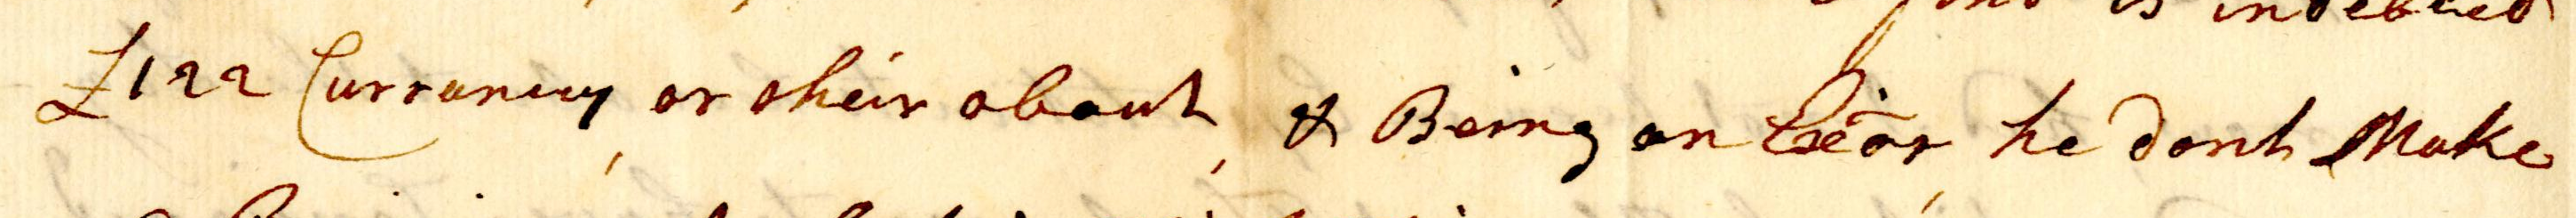£122 Currency or their about, & Being on Exer he dont Make
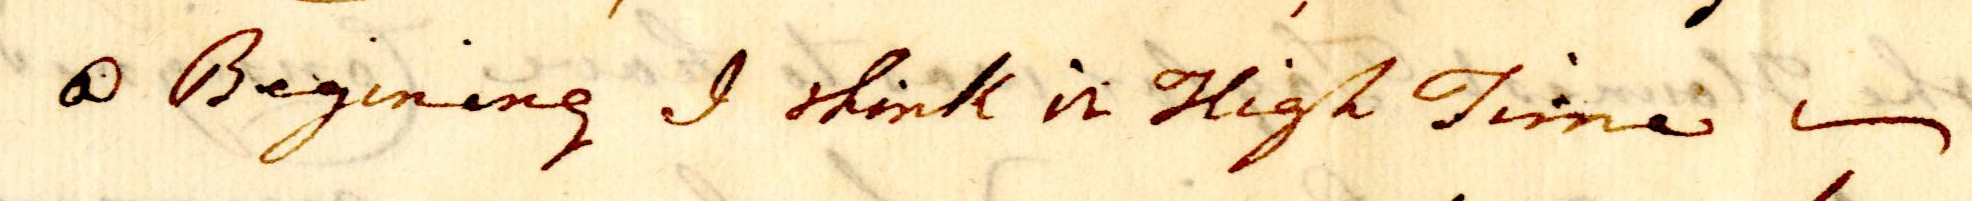a Begining I think is high Time-
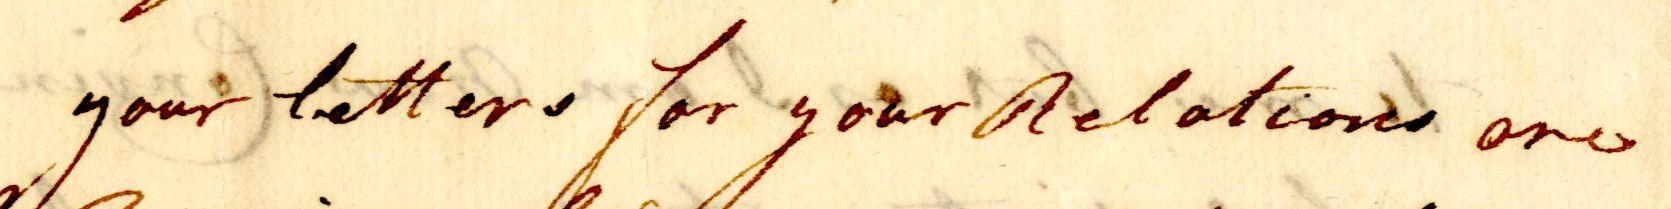your letters for your Relations are
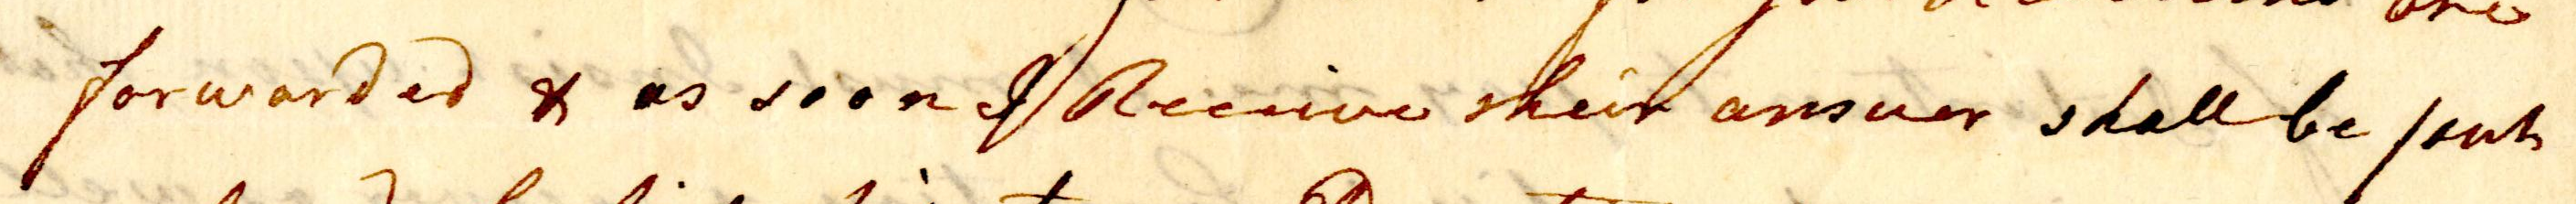forwarded & as soon I Receive their answer shall be put
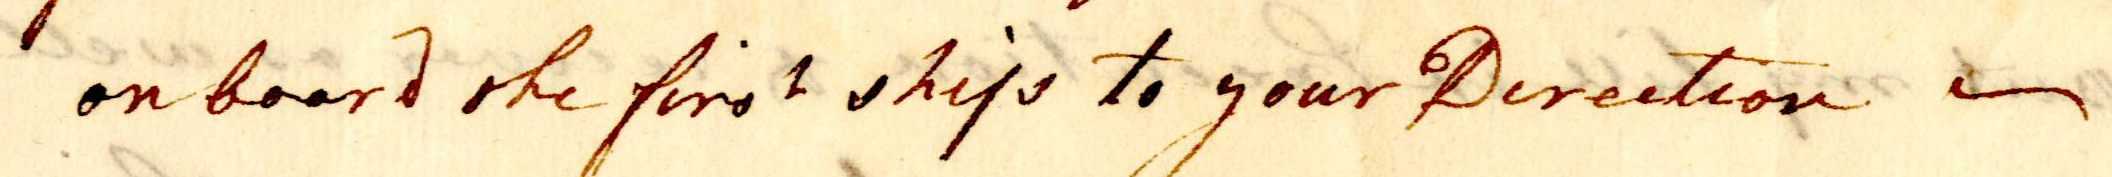on board the first ships to your Direction-
